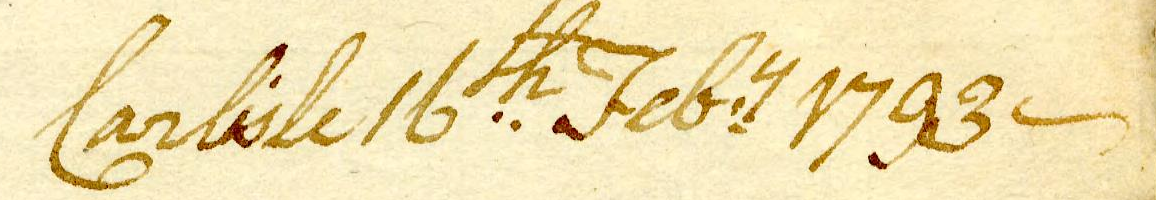Carlisle 16^th: Feb:^y 1793-
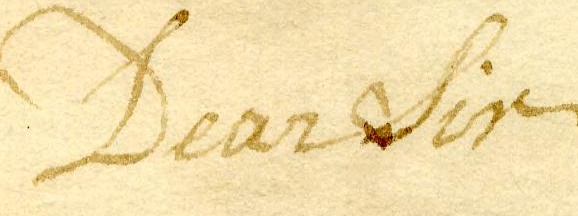Dear Sir
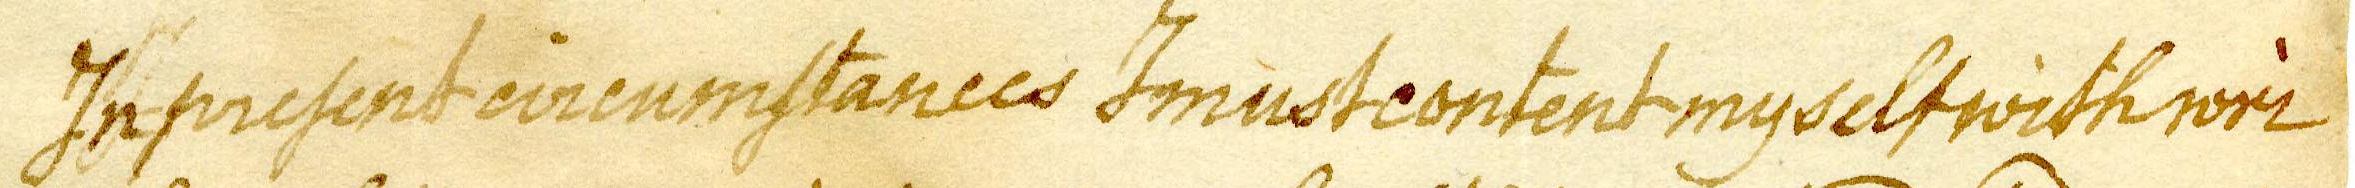In present circumstances I must content myself with wri
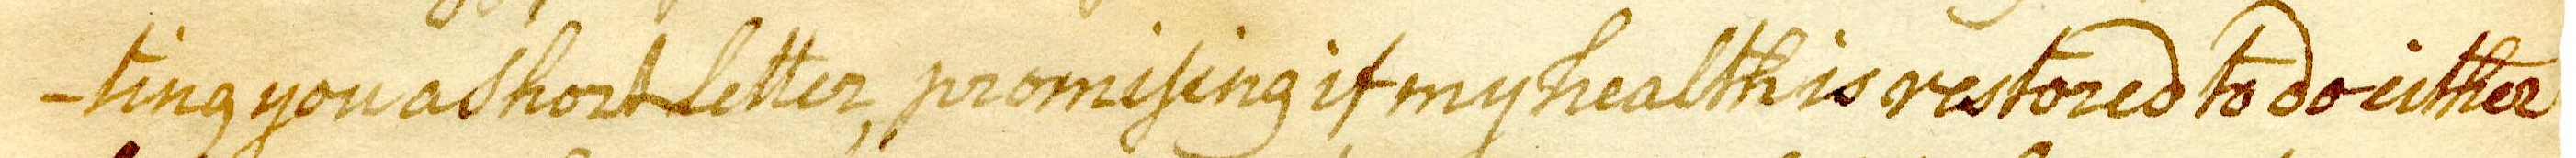-ting you a short letter, promising if my health is restored to do either
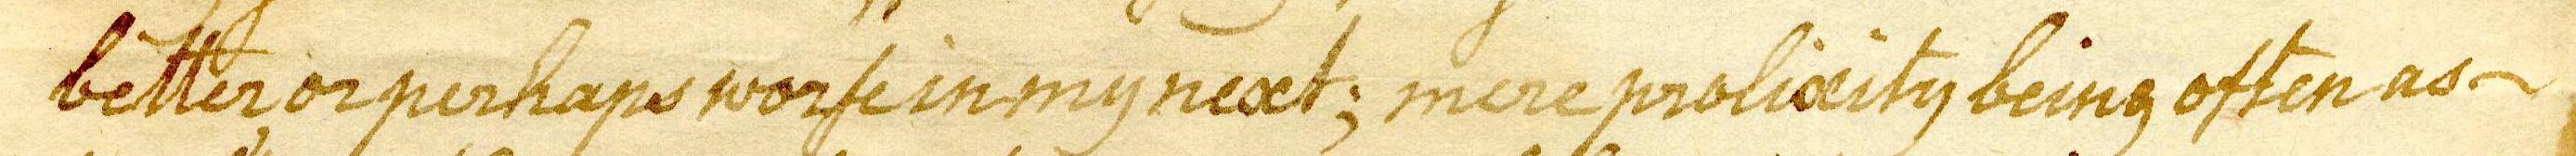better or perhaps worse in my next; mere prolixity being often as-
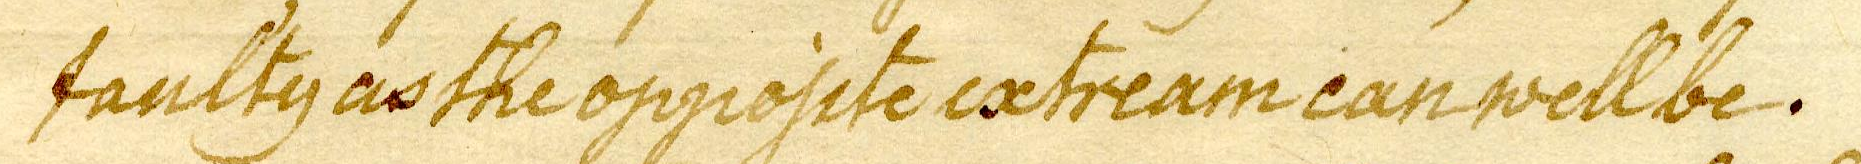faulty as the opposite extream can well be.
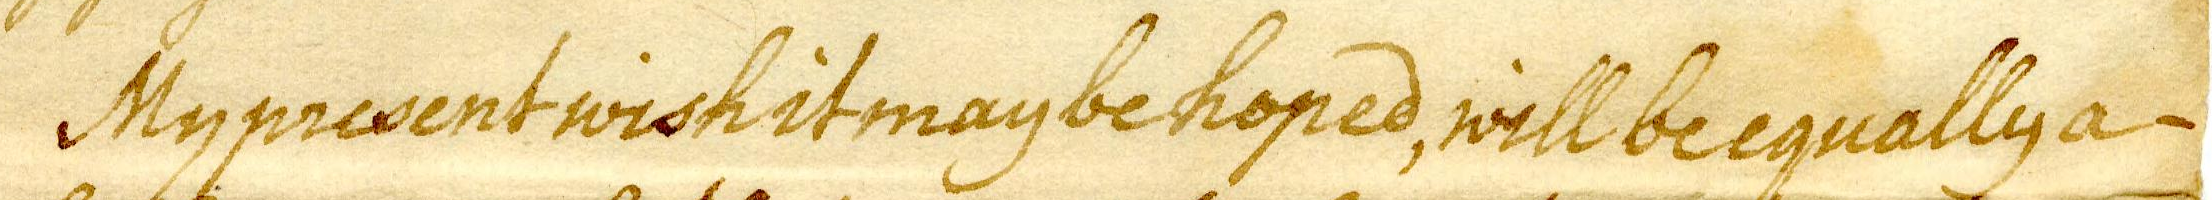My present wish it may be hoped, will be equally a-
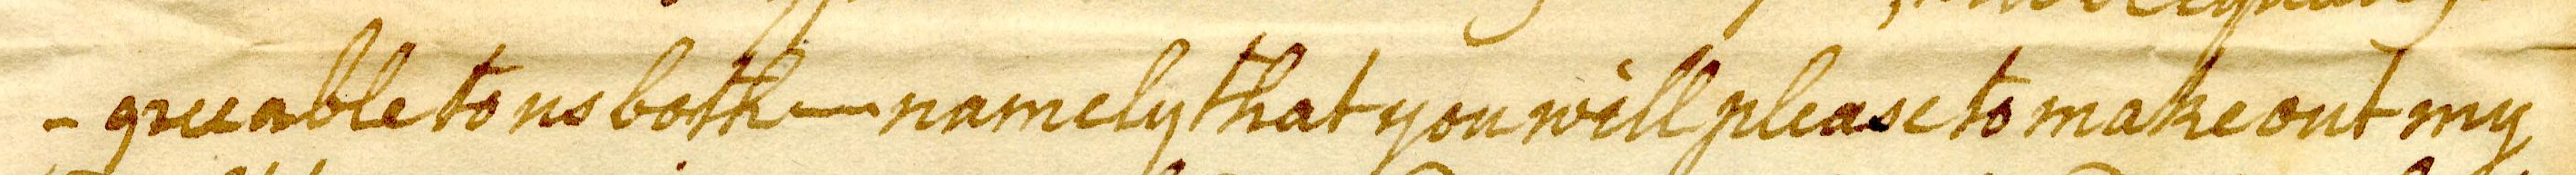-greeable to us both- namely that you will please to make out my
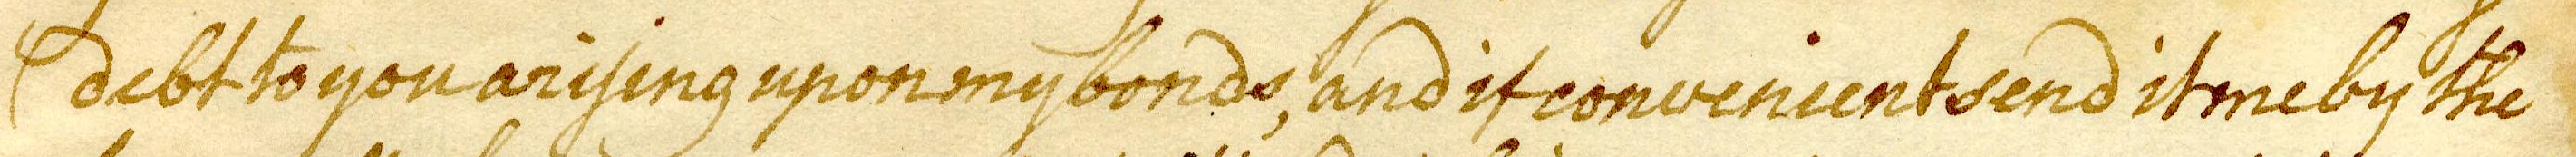debt to you arising upon my bonds, and if convenient send it me by the
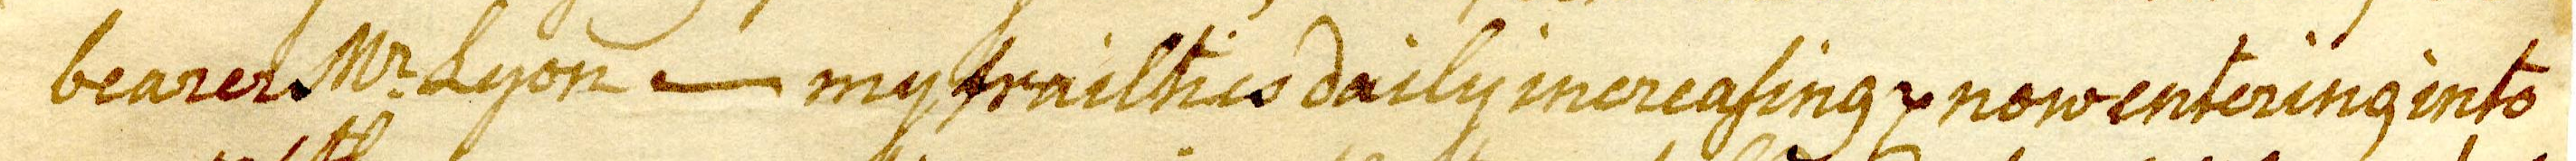bearer M^r. Lyon- my frailties daily increasing & now entering into
